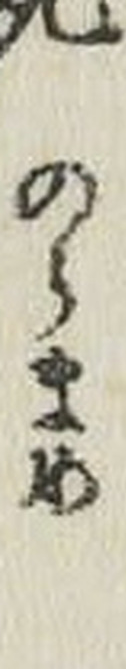のらまめ
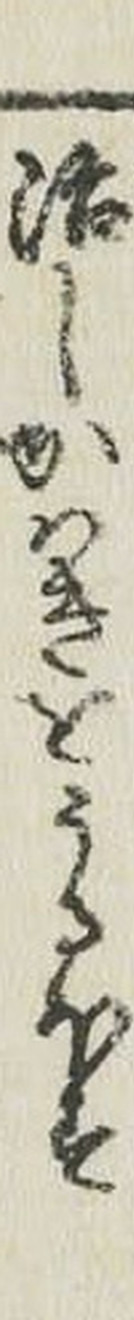治しかわきをうるほす
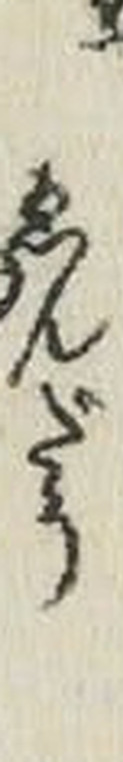ゑんだう
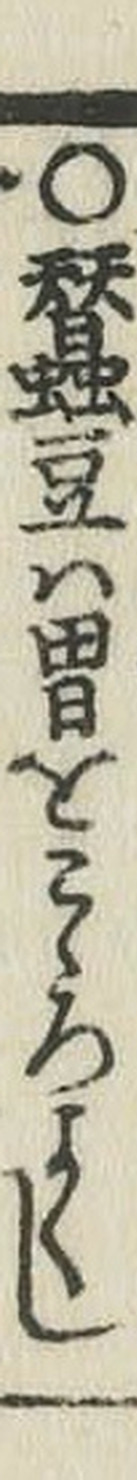○蚕豆は胃をこゝろよくし
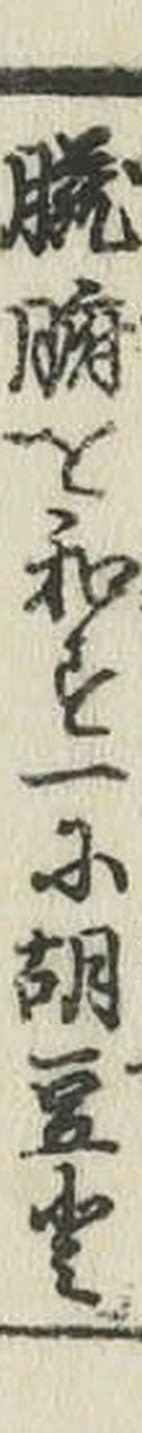臓腑を和す一に胡豆と
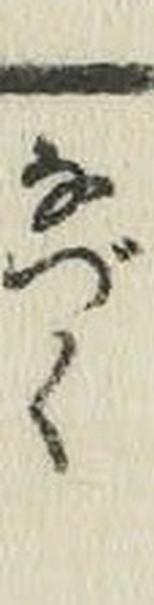なづく
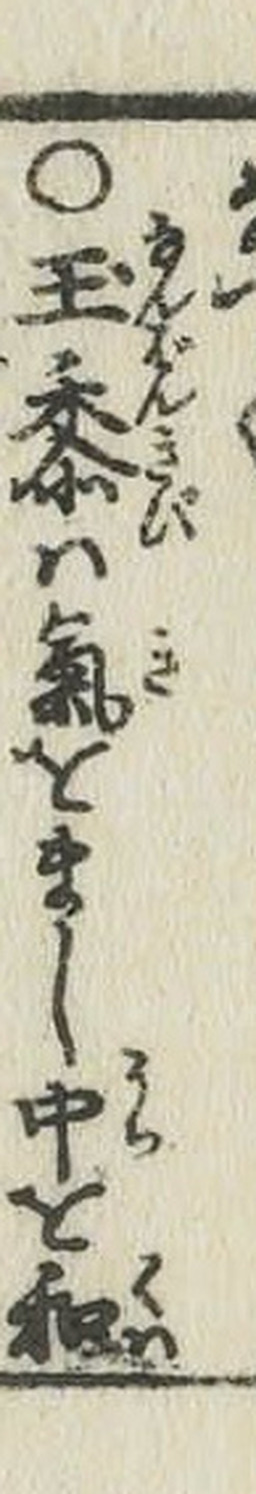○玉黍は気をまし中を和
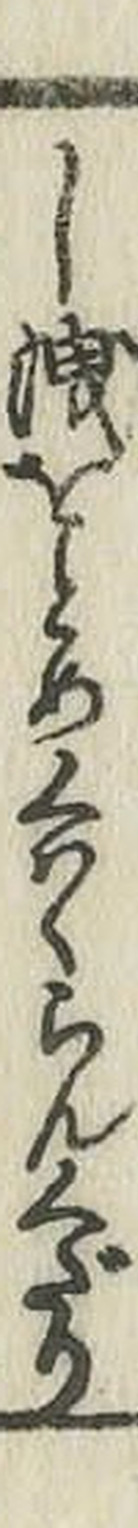し洩をとめくわくらんくだり
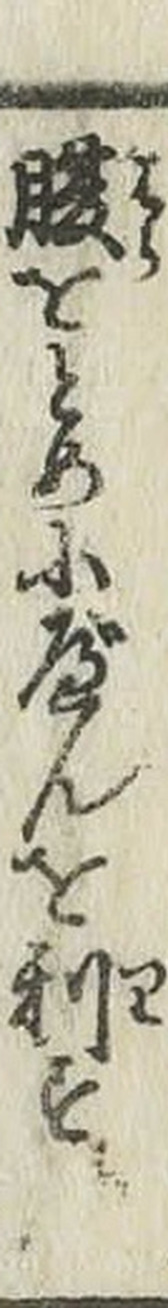腹をとめ小べんを利す
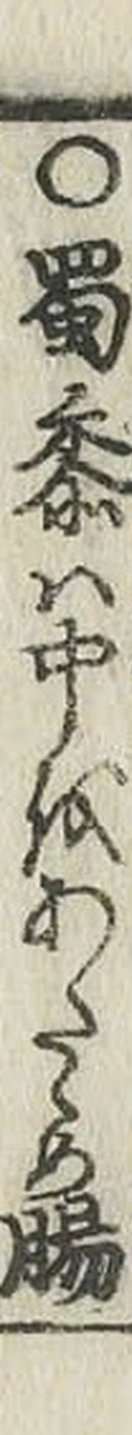○蜀黍は中をあたゝめ腸
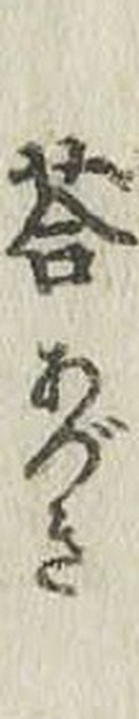荅あづき
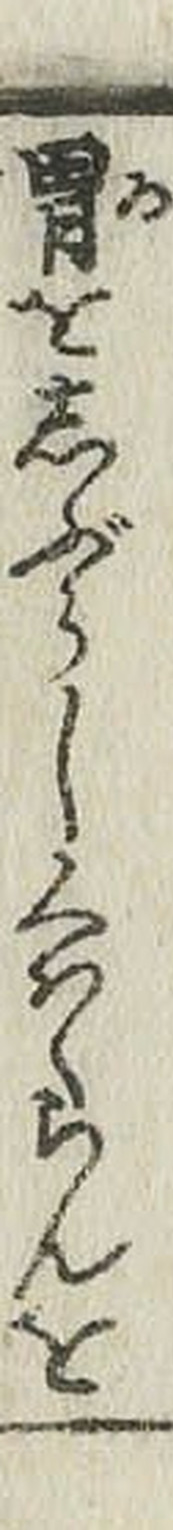胃をしぶらしくわくらんを
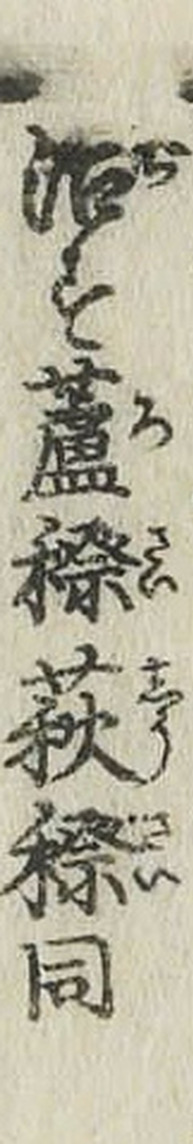治す蘆穄萩穄同
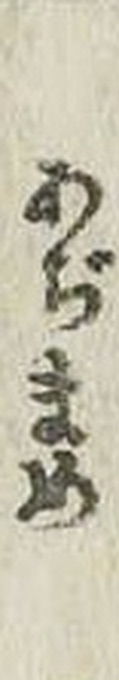あぢまめ
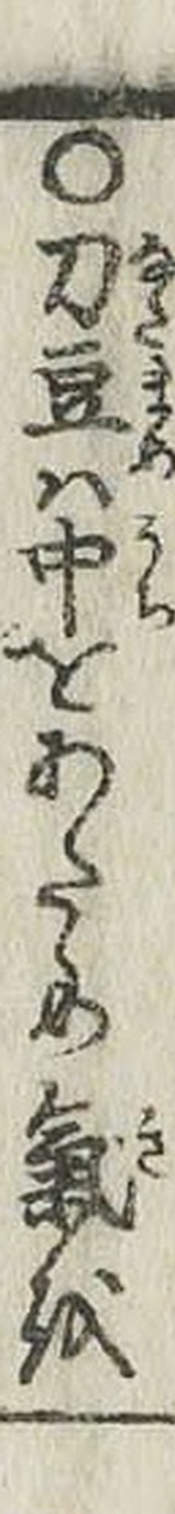○刀豆は中をあたゝめ気を
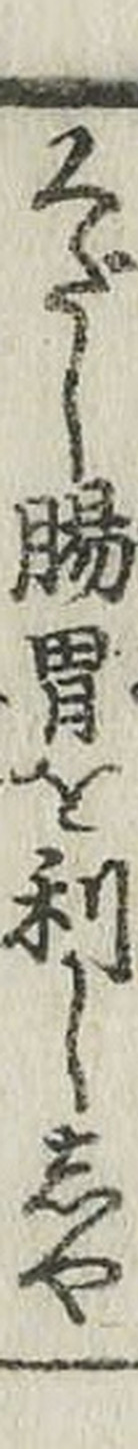くだし腸胃を利ししや
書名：増補頭書訓蒙図彙大成 10巻 7:巻之14-16
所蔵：東京学芸大学教育コンテンツアーカイブ
